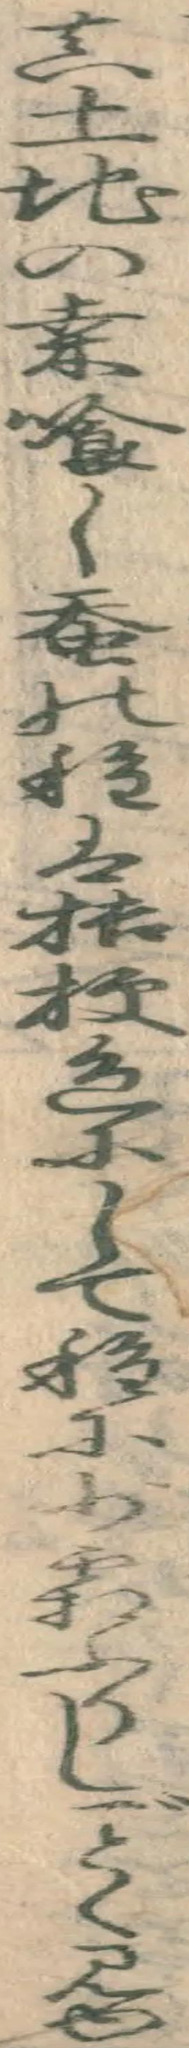真土地の桑喰し蚕の種は桔梗色にして種に少霜ふりしごとく見ゆ
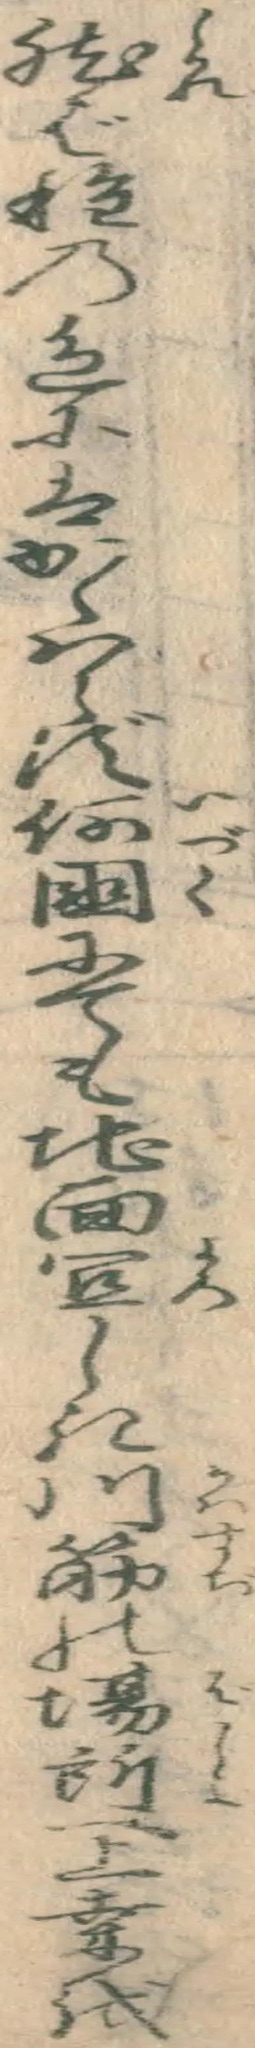然ば種の色にはかゝはらず何国にても地面宜しき川筋の場所へ上桑を
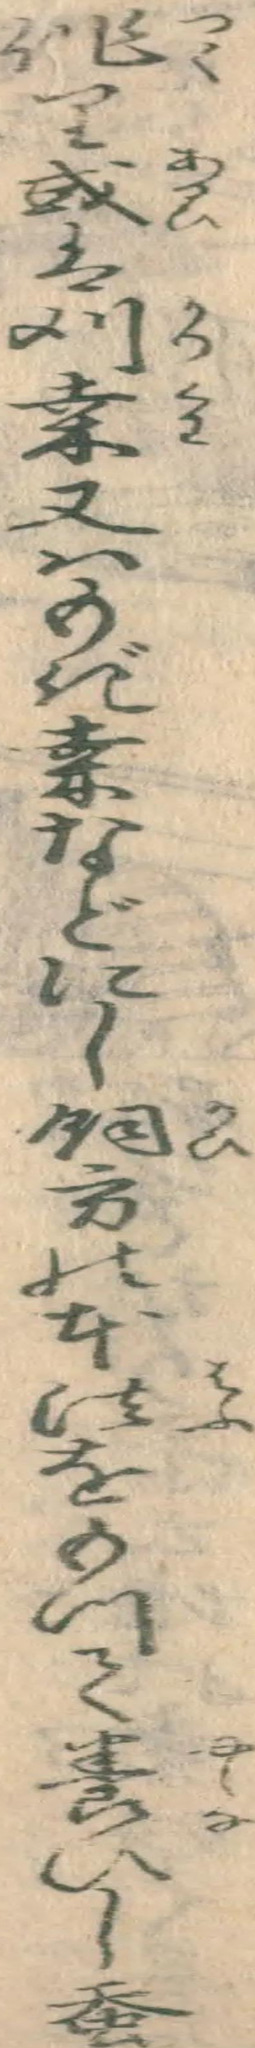作り或は刈桑又はもぎ桑などにし飼方の本法をもって養ひし蚕
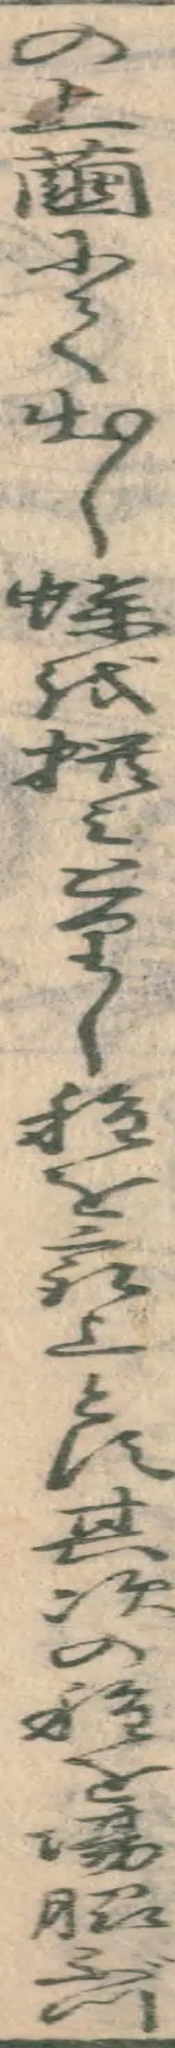の上繭にて出し蝶を撰みとりし種を最上とす其次の種を場脇ぶつ
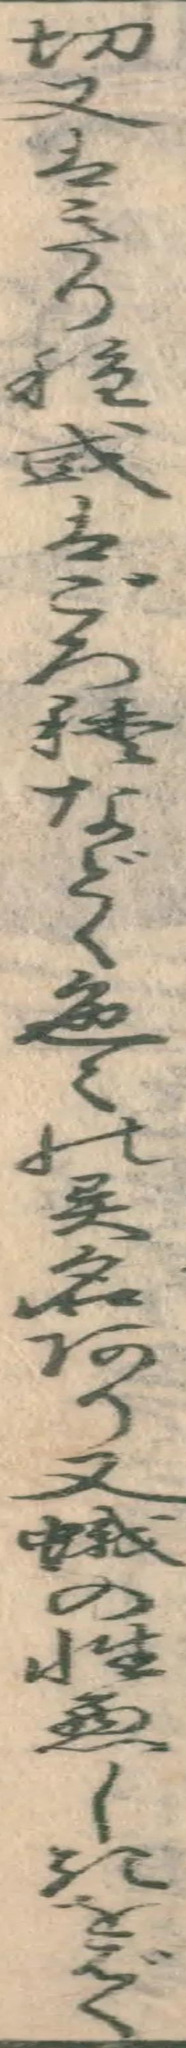切又はきり種或はごろ種などゝ色々の異名あり又蛾の性悪しきをばく
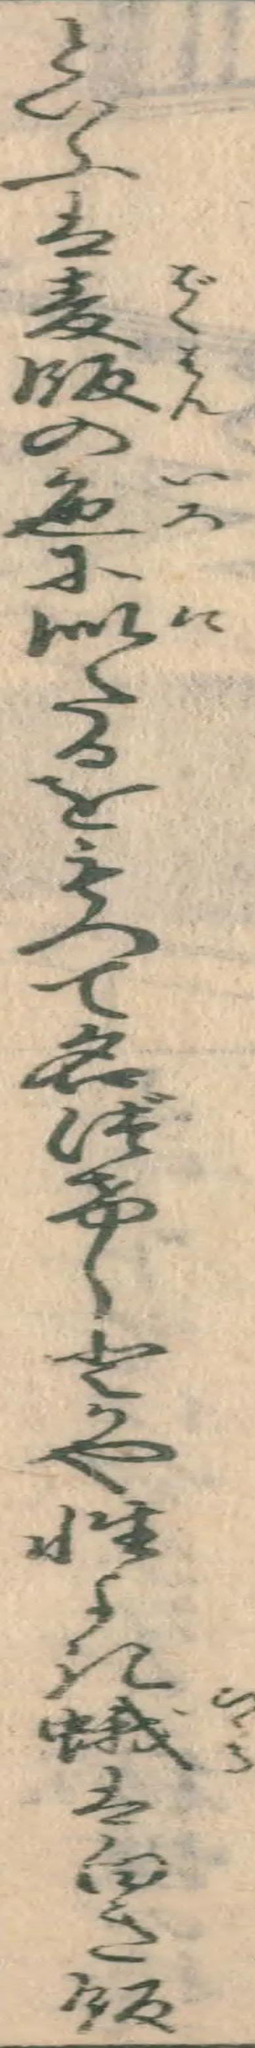といふは麦飯の色に似たるをもって名づけしとかや性よき蛾は白き飯
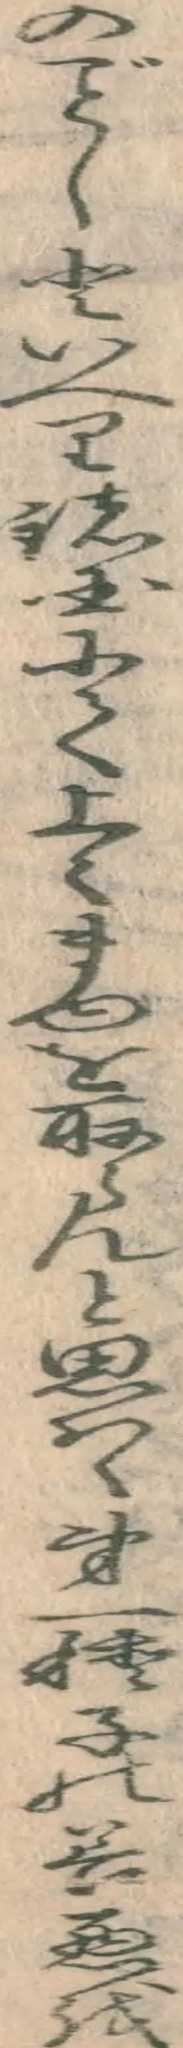のごとしといへり諸国にて上々まゆを取らんと思はゝ第一種子の善悪を
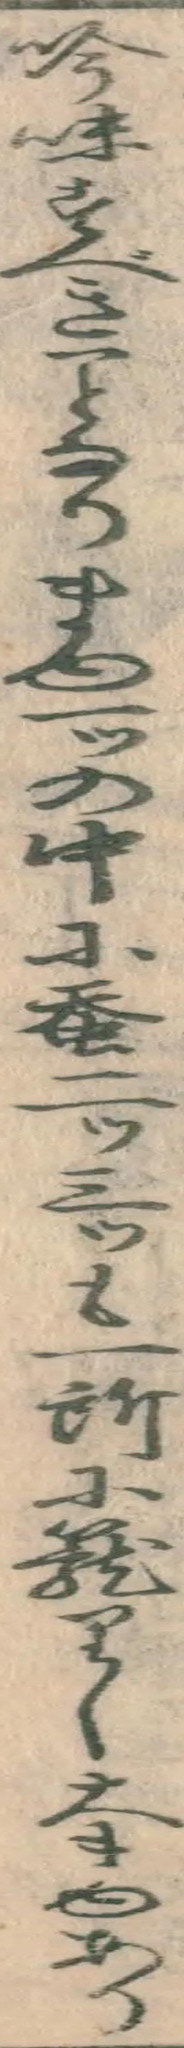吟味すべきことなりまゆ一ッの中に蚕二ッ三ッも一所に籠りし大まゆあり
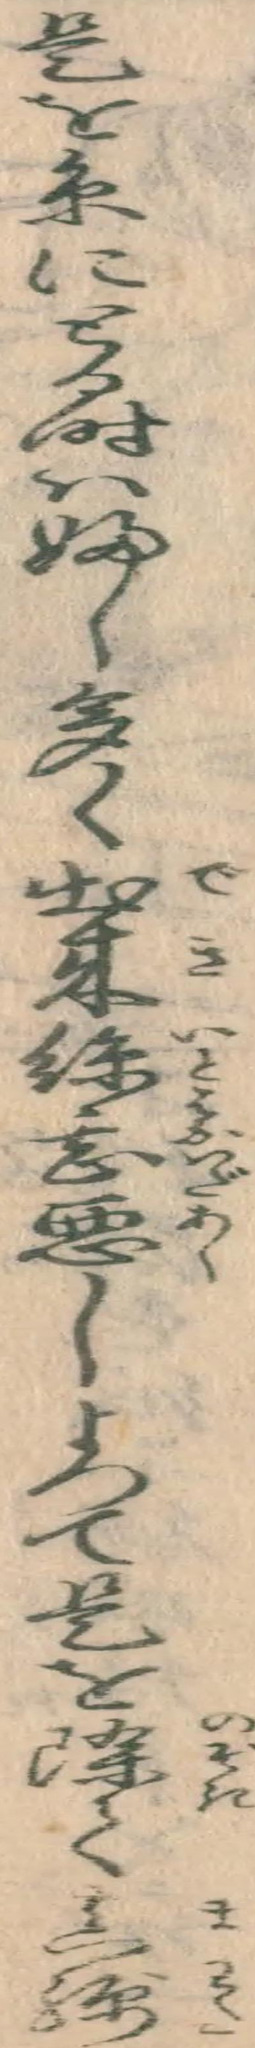是を糸にとる時はふし多く出来糸甚悪しよって是を除て真綿
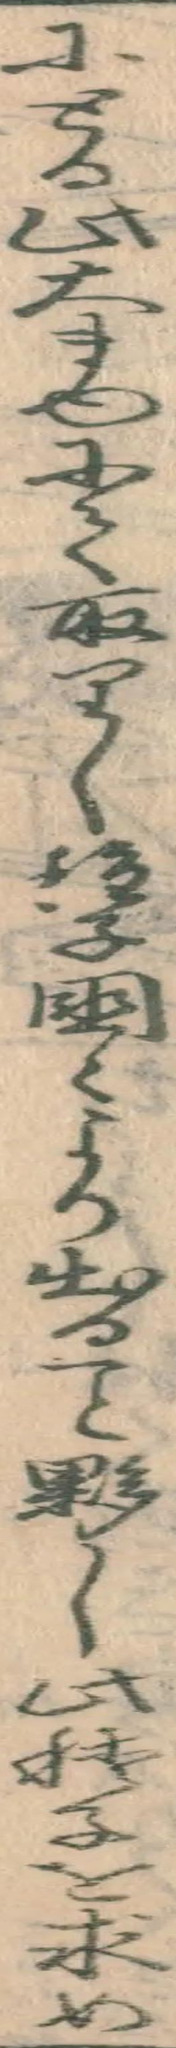にとる此大まゆにて取りし種子国々より出ること夥し此種子を求め
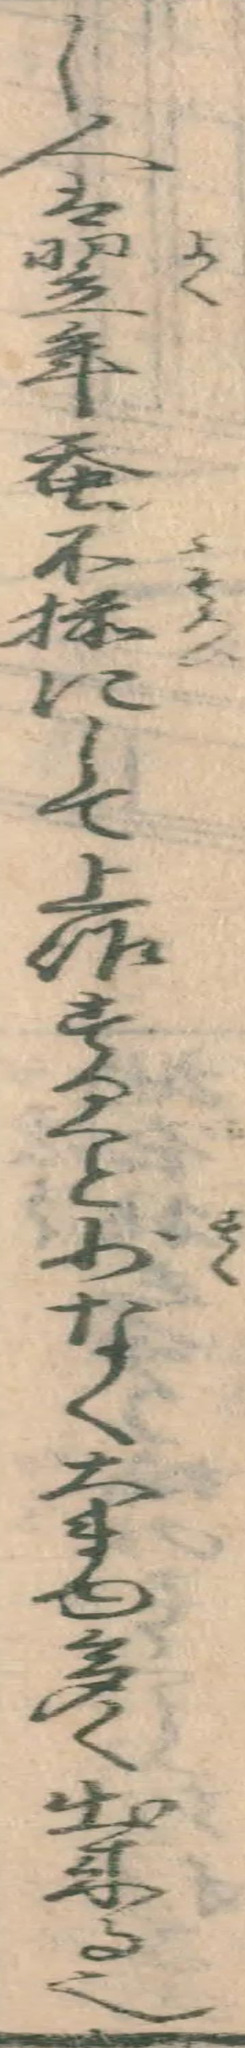し人は翌年蚕不揃にして上作すること少なく大まゆ多く出来る也
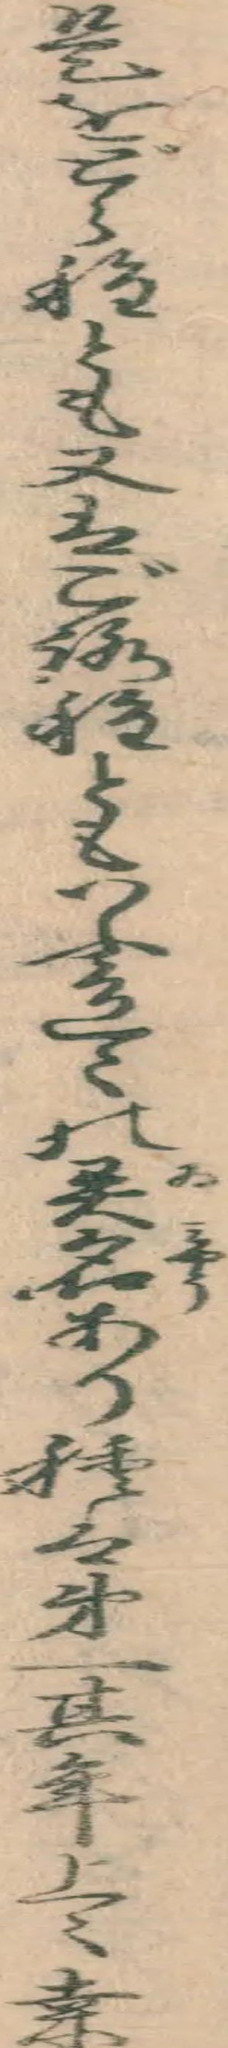是をどら種とも又はごろ種ともいふ色々の異名あり種は第一其年上々桑
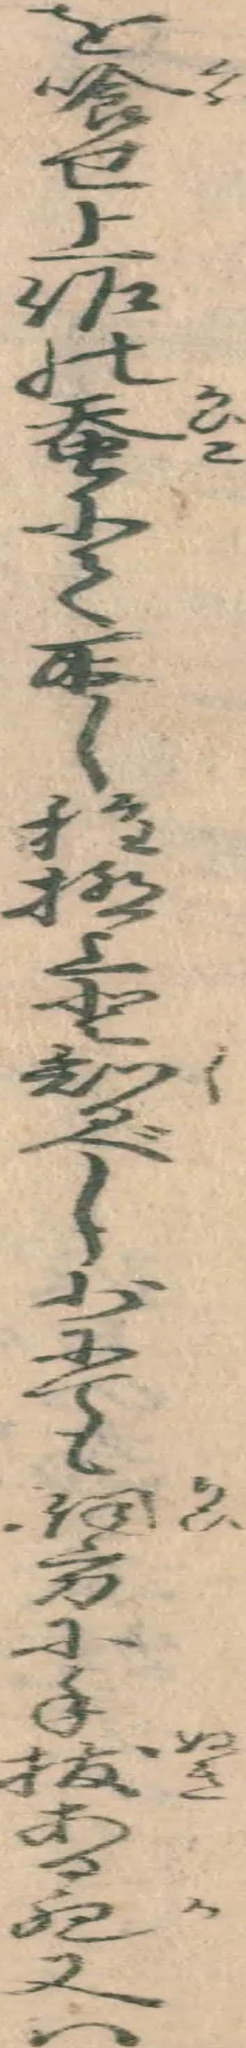を喰せ上作の蚕にて取し種極上と知るべし少にても飼方に手抜ある歟又は
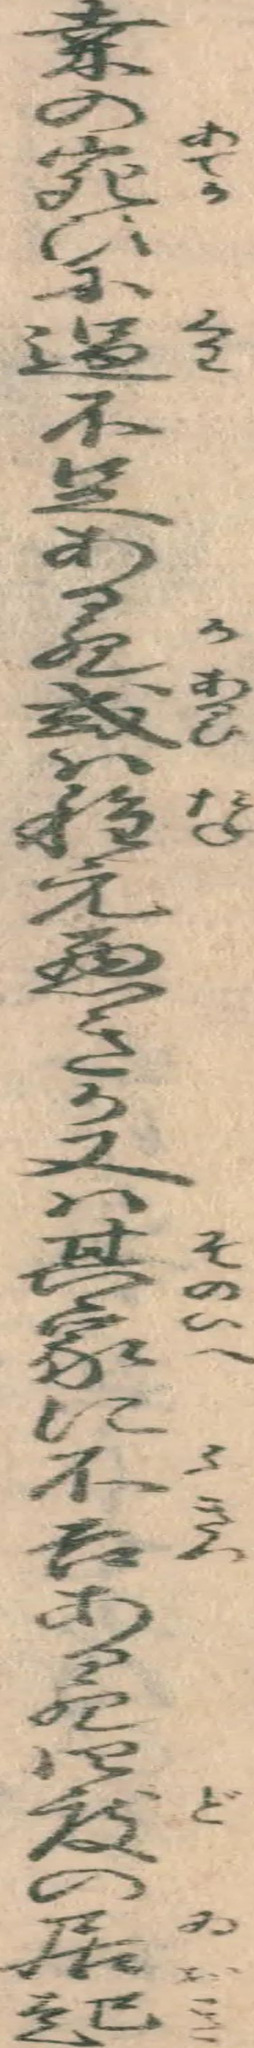桑の宛ひに過不足ある歟或は種元悪きか又は其家に不吉ある歟四度の居起
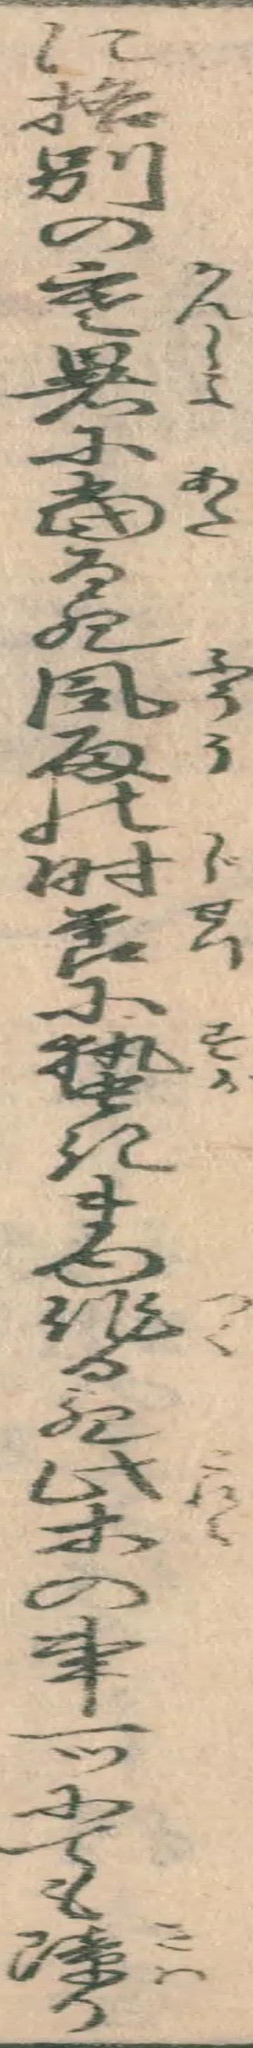に格別の寒暑に当る歟風雨の時節に蟄きまゆ作る歟此等の事一ッにても障り
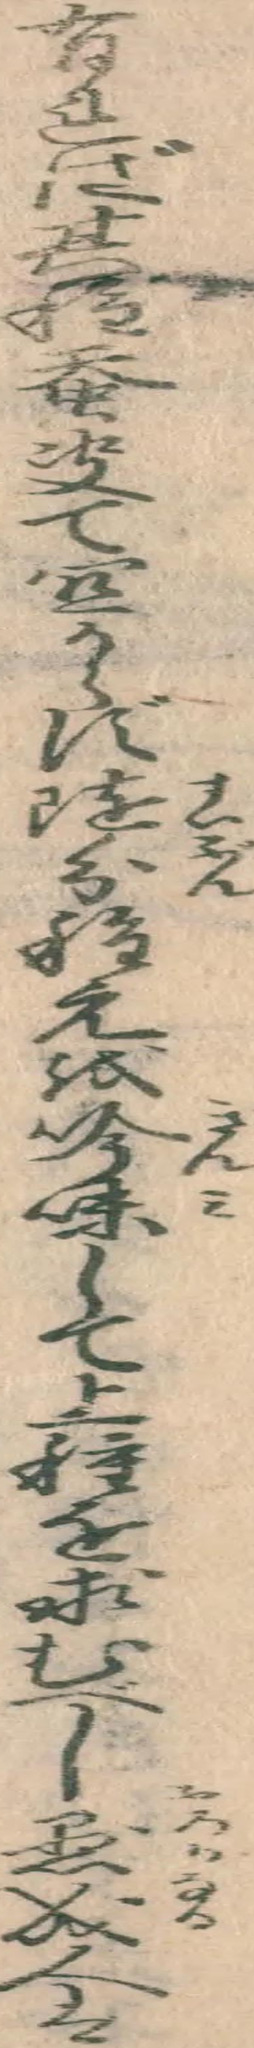有れば其種蚕決て宜からず随分種元を吟味して上種を求むべし愚成人は
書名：養蚕秘録 3巻. [1]
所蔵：国立国会図書館 National Diet Library, JAPAN
